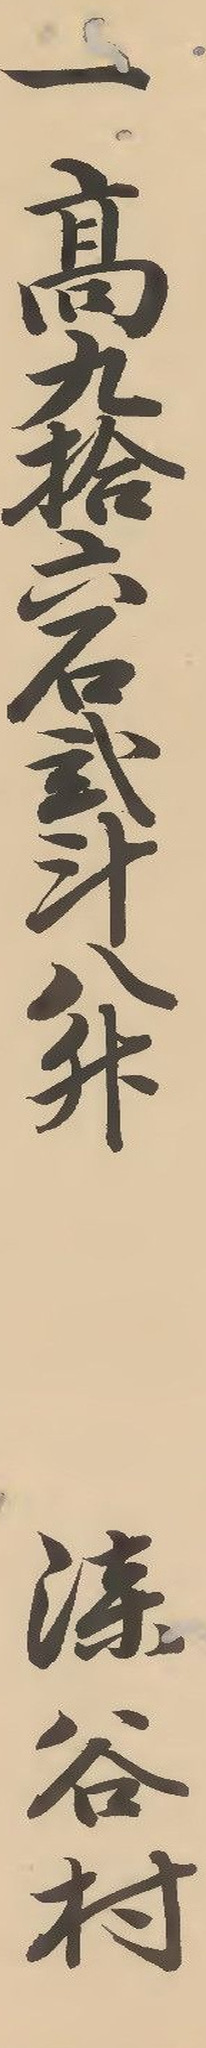一高九拾六石弐斗八升漆谷村
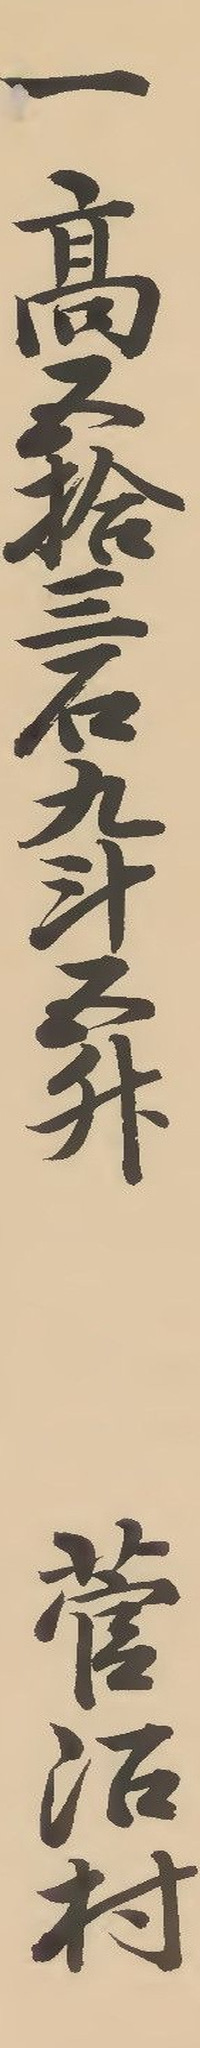一高五拾三石九斗五升菅沼村

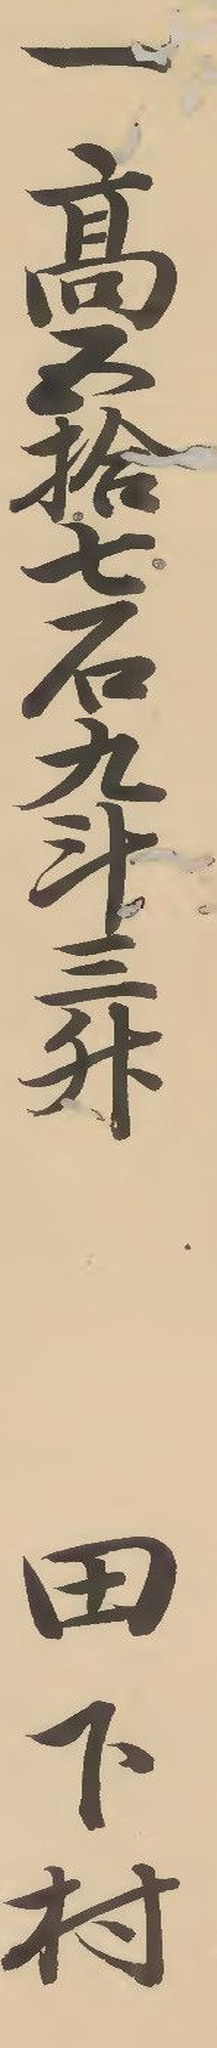一高五拾七石九斗三升田下村
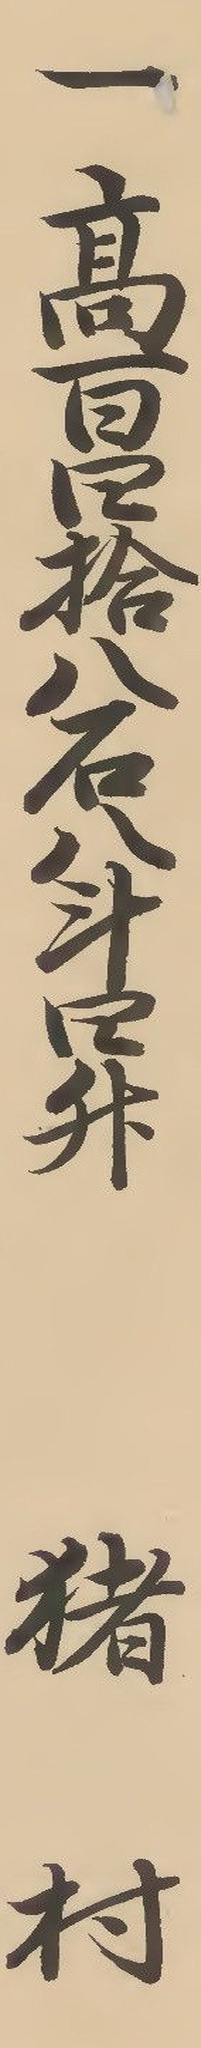一高百四拾八石八斗四升猪村
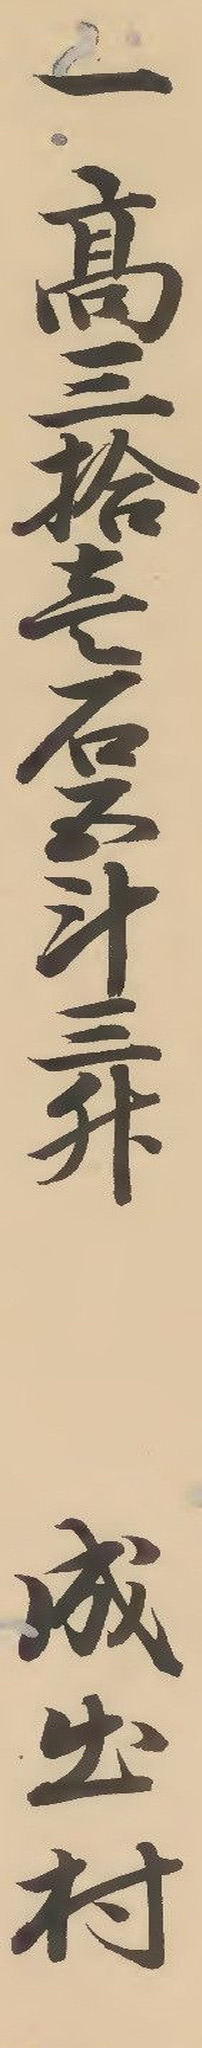一高三拾壱石五斗三升成出村
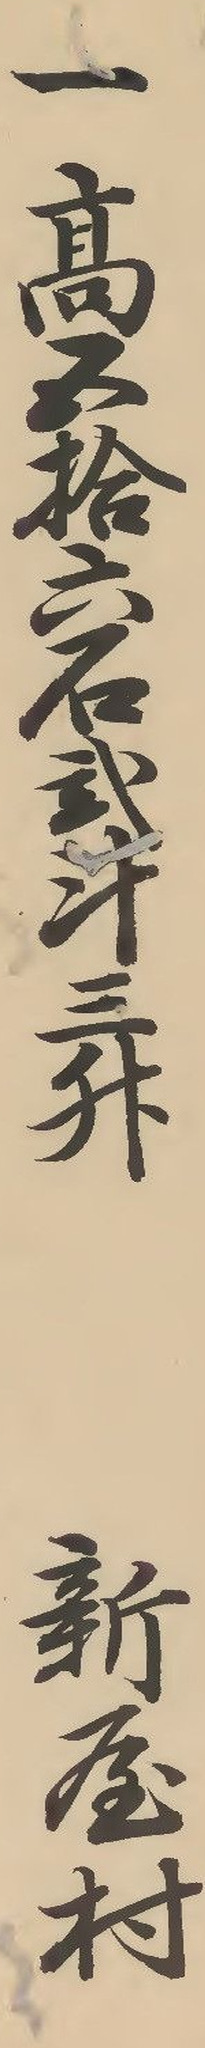一高五拾六石弐斗三升新屋村
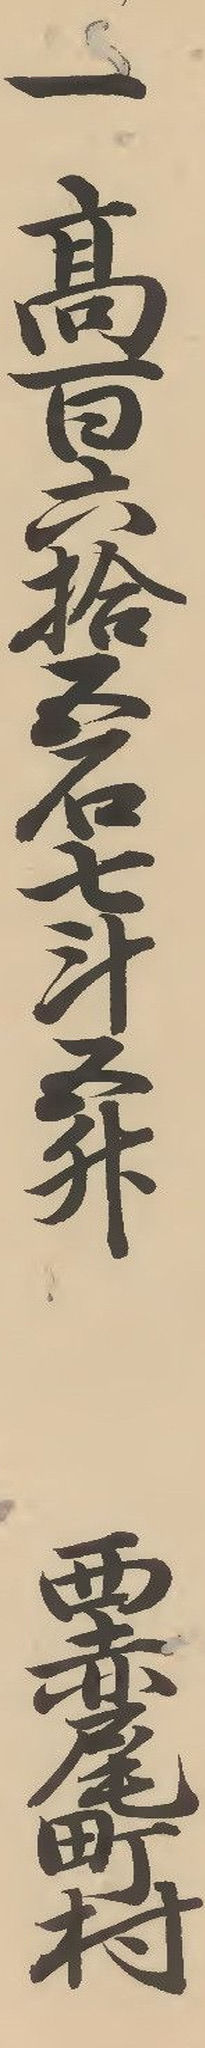一高百六拾五石七斗五升西赤尾町村
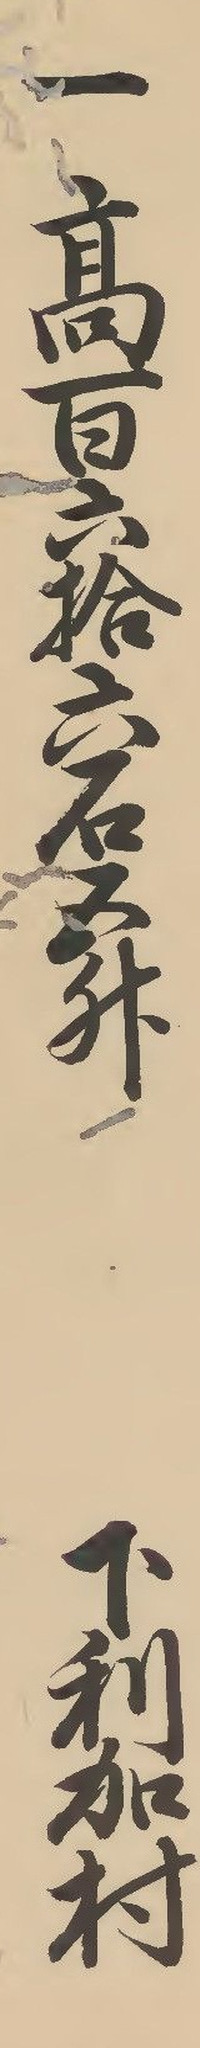一高百六拾六石五升下利加村

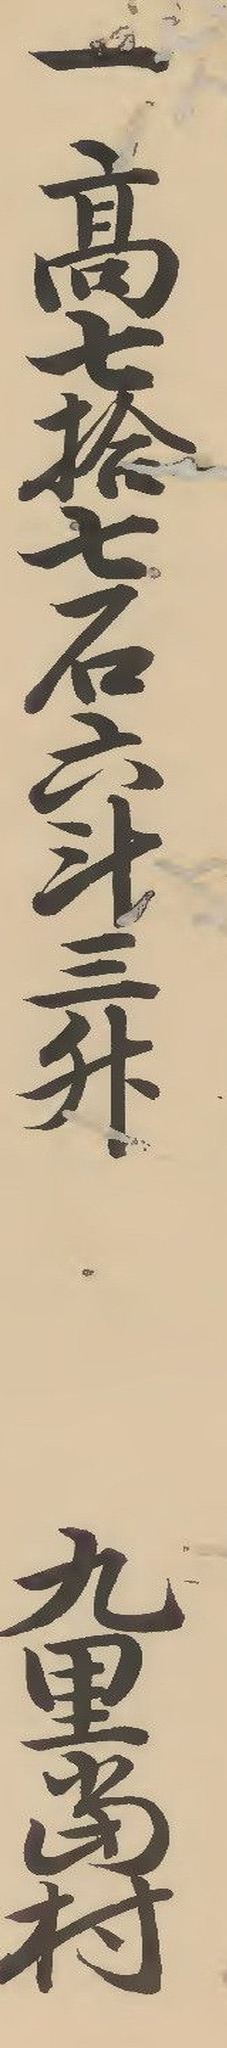一高七拾七石六斗三升九里当村
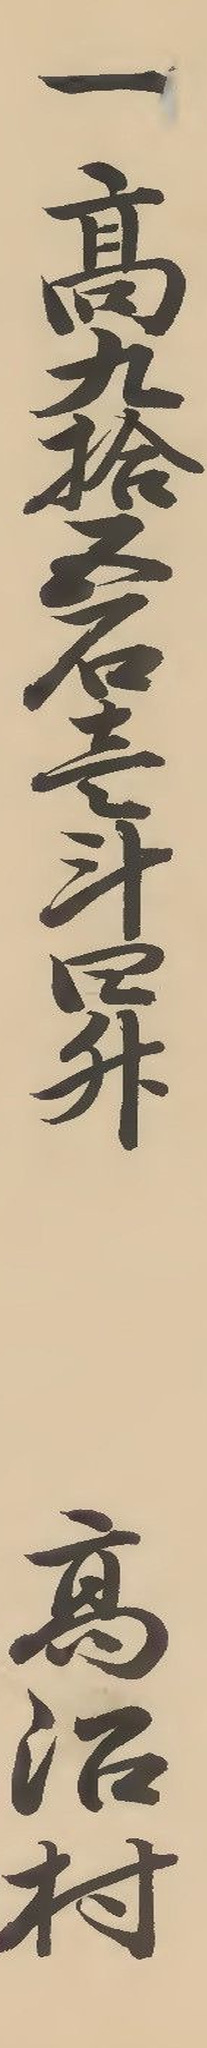一高九拾五石壱斗四升高沼村
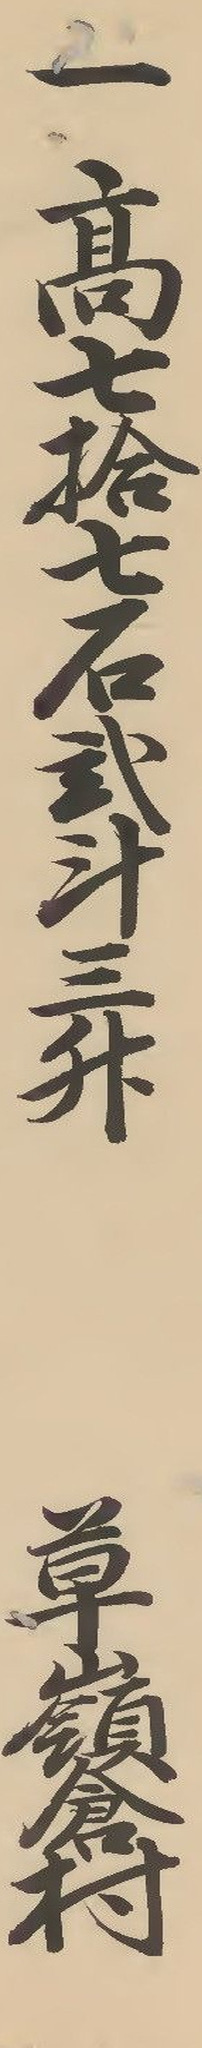一高七拾七石弐斗三升草嶺倉村
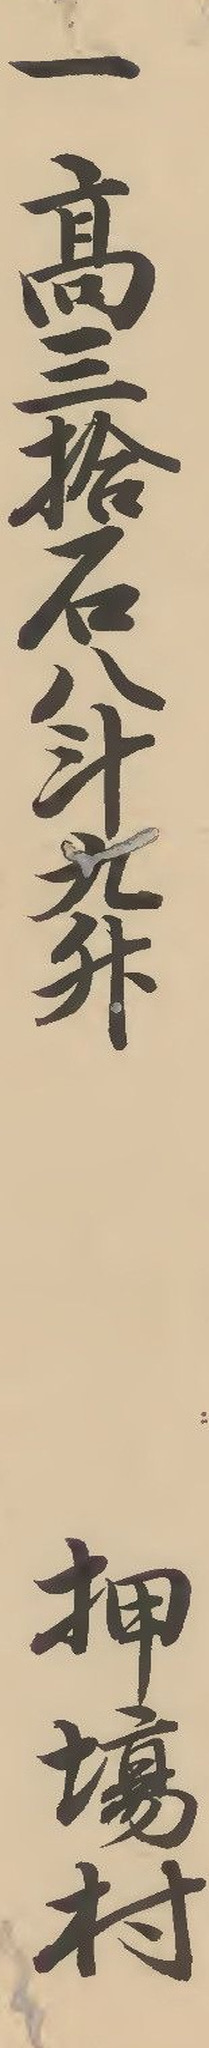一高三拾石八斗九升押場村
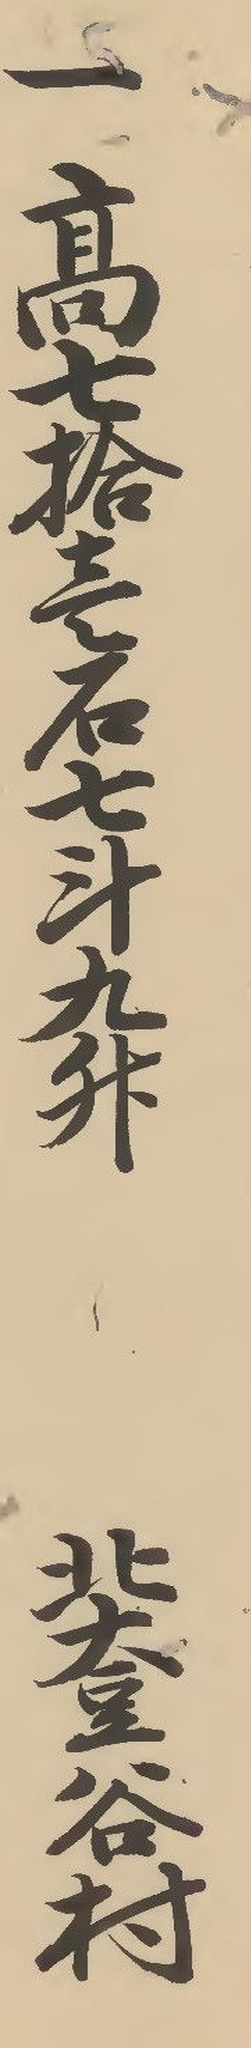一高七拾壱石七斗九升北大豆谷村
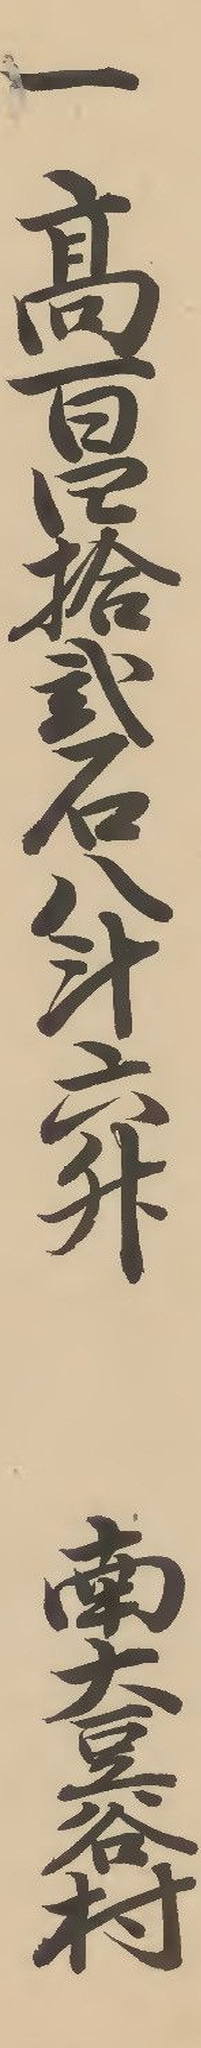一高百四拾弐石八斗六升南大豆谷村
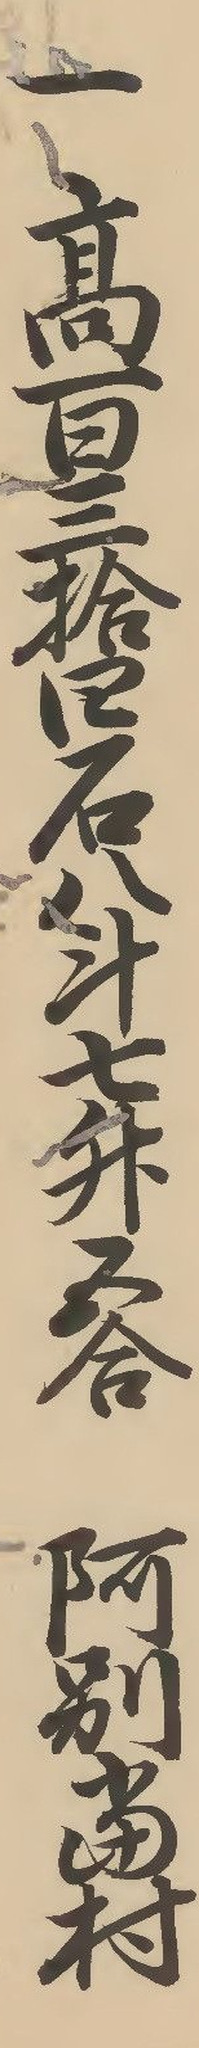一高百三拾四石八斗七升五合阿別当村

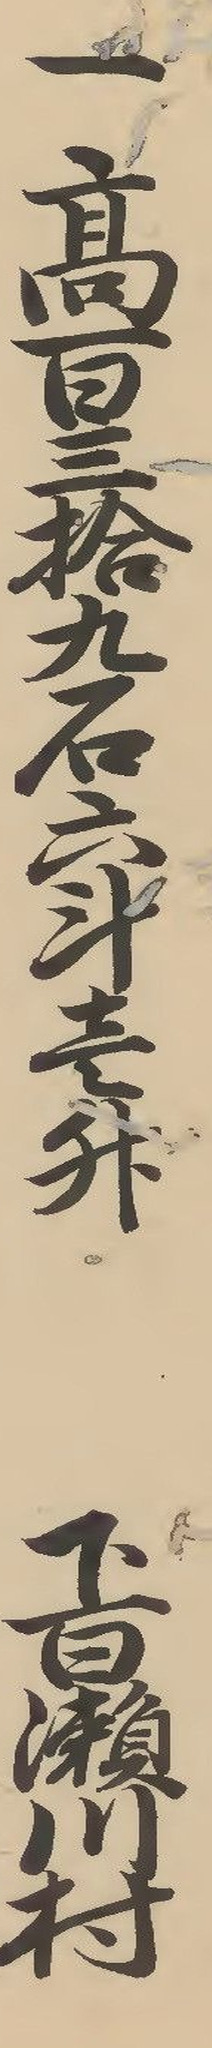一高百三拾九石六斗壱升下百瀬川村
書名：越中国郷帳
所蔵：国立公文書館 National Archives of Japan
